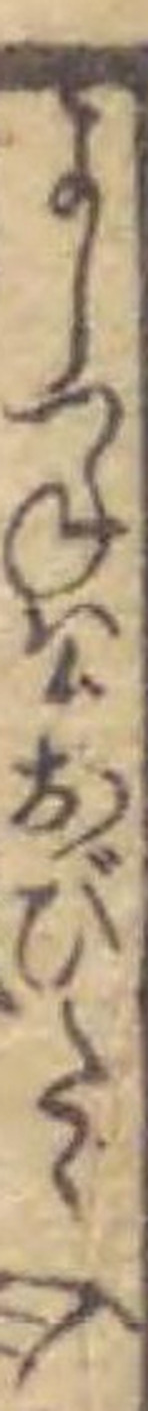よしつね公おびたゝ
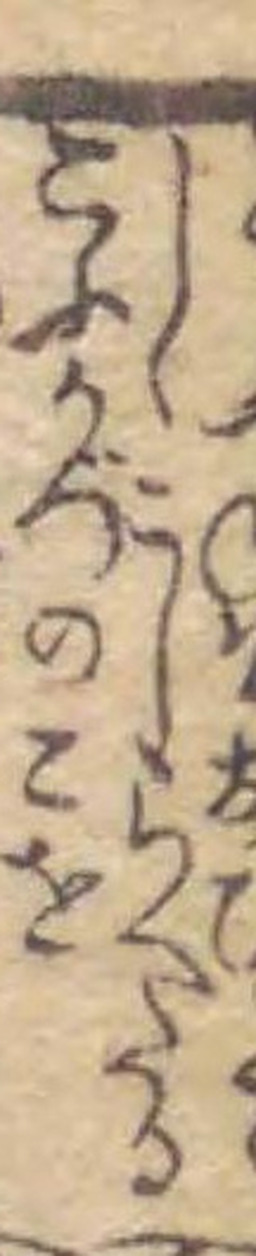こふかづのこを
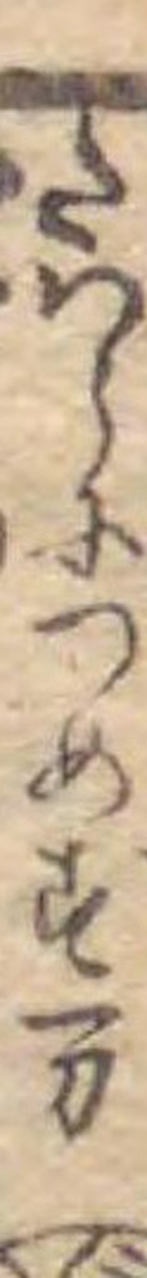たはらにつめす万
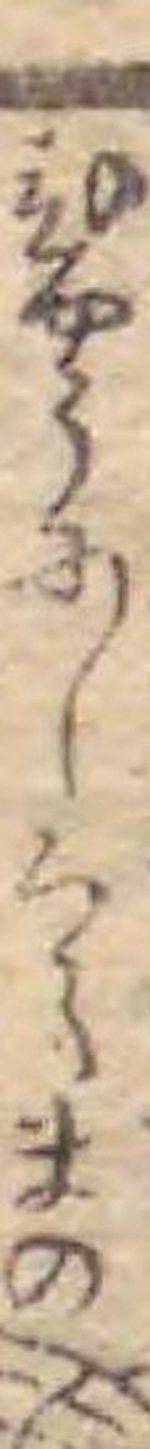ひやうにしくらまの
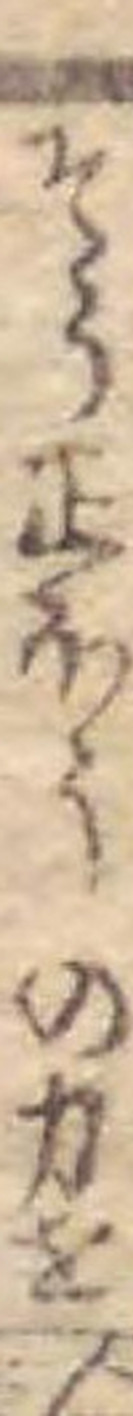そう正ほうの力を
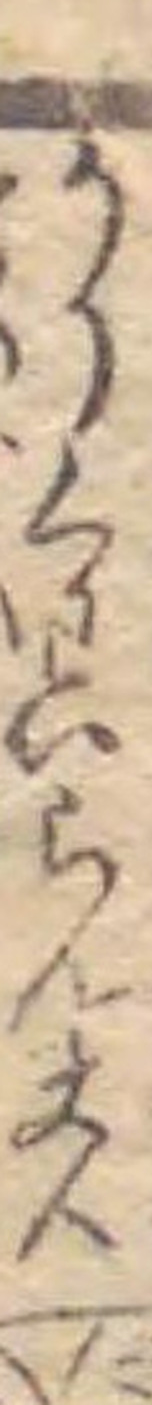かりくわいらん夫人
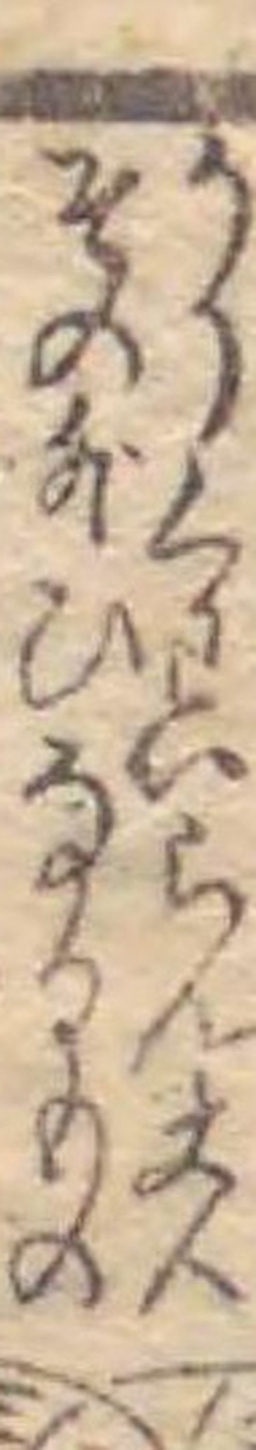その外ひなるもの
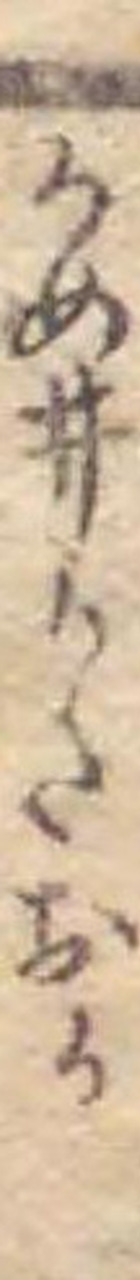かめ井かたおか
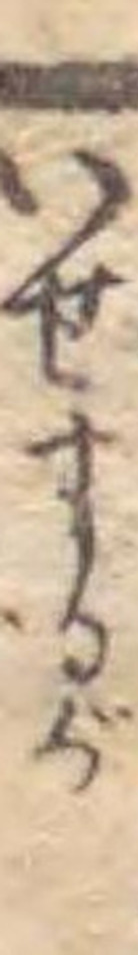いせするが
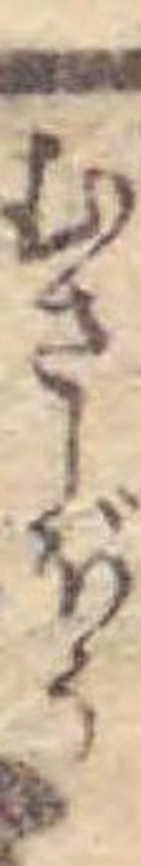むさしぼう
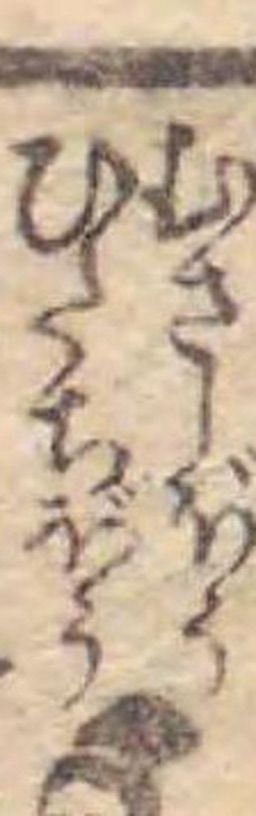ひたちぼう
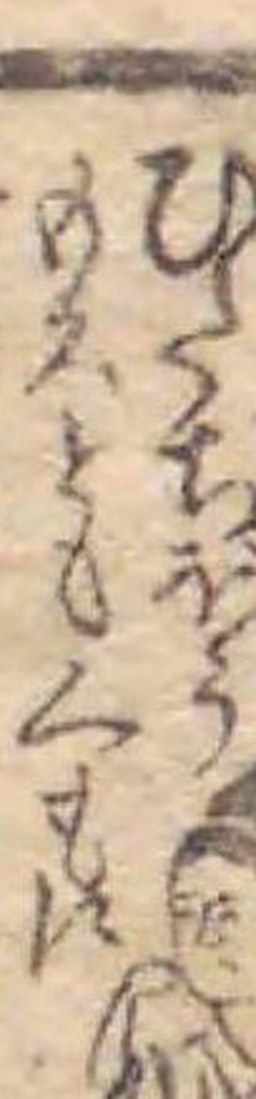もろともくもに
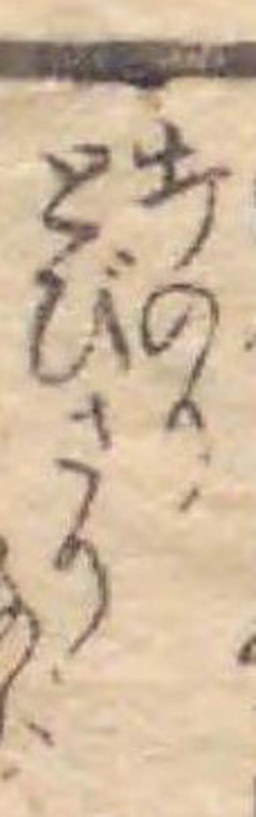とびさり給ふ
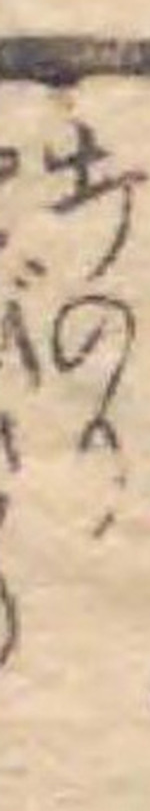打のり
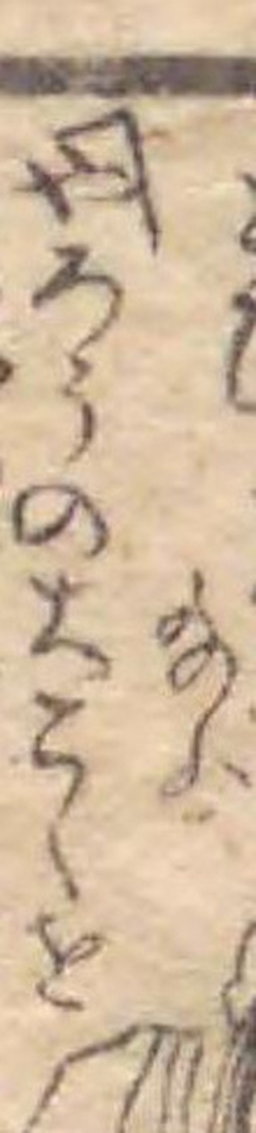〽やろうの大こくを
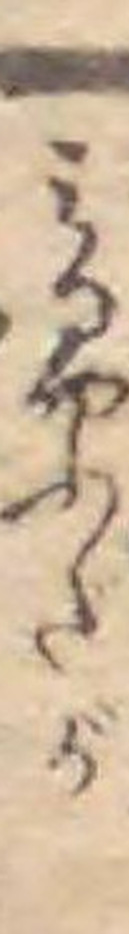みるやふだが
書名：悦贔負蝦夷押領 : 3巻
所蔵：国立国会図書館 National Diet Library, JAPAN
